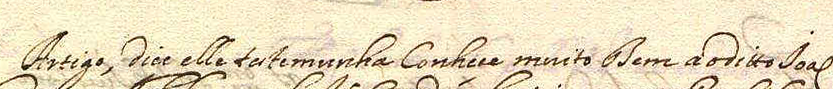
Artigo, dice elle testemunha Conhece muito Bem ao ditto Ioaõ
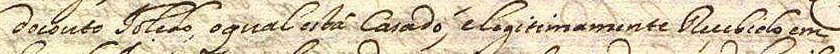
do couto Toledo, o qual está Casado, e legitimamente Recebido em
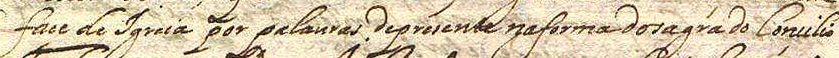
face de Igreia por palauras de presente na forma do sagrado Concilio
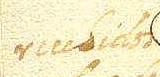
recebidos
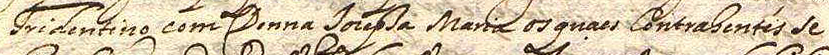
Tridentino com Donna Iozepha Maria os quaes Contrahentes se
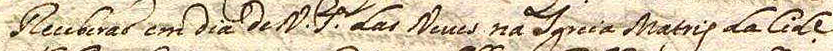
Receberaõ em dia de N. S.ra das Neues na Igreia Matris da Cid.e
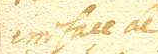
em face de
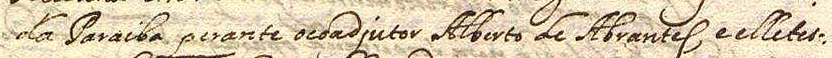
da Paraiba perante o coadjutor Alberto de Abrantes, e elle tes
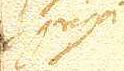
Igreja
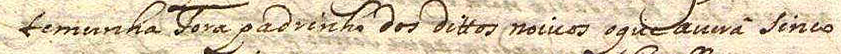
temunha Fora padrinho dos dittos noiuos o que auerâ sinco
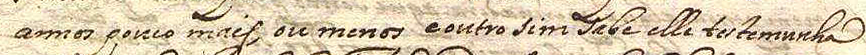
annos pouco mais, ou menos, e outrosim sabe elle testemunha
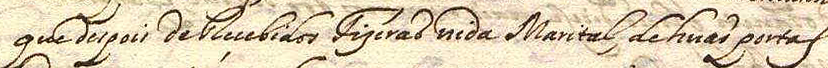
que despois de Recebidos Fizeraõ vida Marital, de huās portas
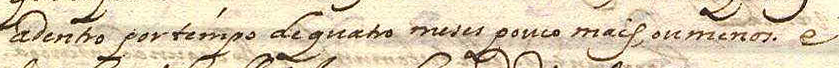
adentro por tempo de quatro meses pouco mais, ou menos. e
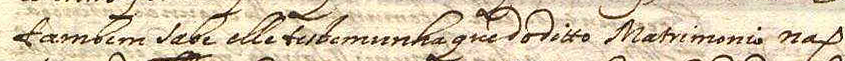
tambem sabe elle testemunha que do ditto Matrimonio naõ
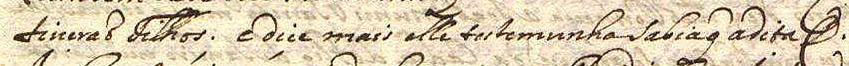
tiueraõ Filhos; e dice mais elle testemunha sabia q̄ a dita D.
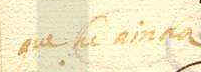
que he ainda
